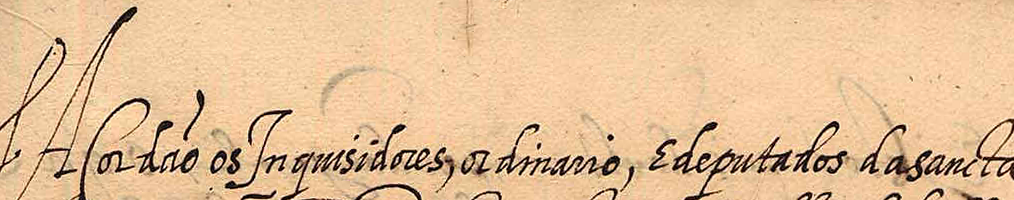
ACordão os Jnquisidores, ordinario, E deputados da sancta
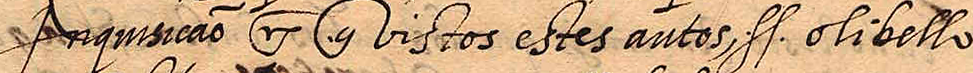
Jnquisição c̄ꝭ q̅ vistos estes autos, .ss. o libello
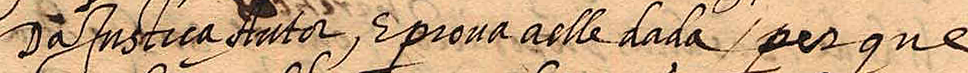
Da Justiça Autor, E proua a elle dada / per que
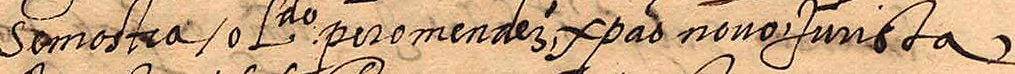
se mostra / o L.do pero mendez̅, xpaõ nouo, Jurista,
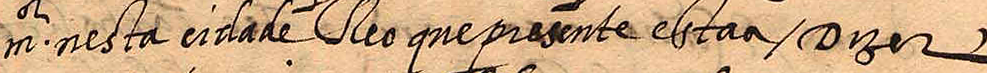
mor. nesta çidade Reo que presente estaa / Dizer,
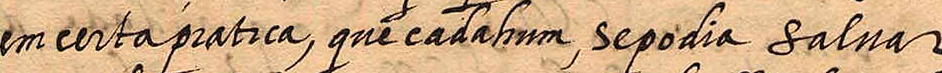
em certa pratica, que cada hum, se podia saluar
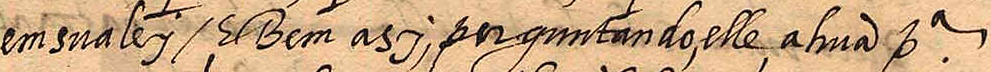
em sua ley / E Bem asj, perguntando, elle, a huā pa.
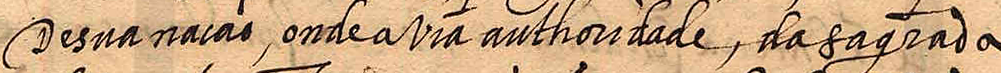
De sua nação, onde avia authoridade, da sagrada
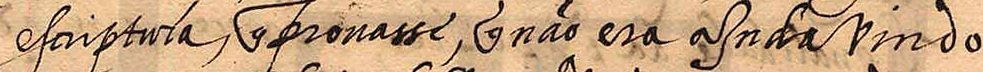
escriptura, q̅ provasse, q̅ não era aJnda vindo
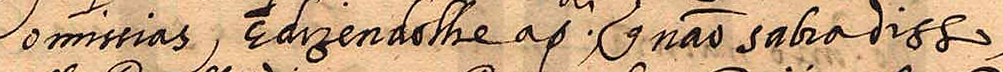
o missias, E dizendolhe a pa. q̅ não sabia disso,
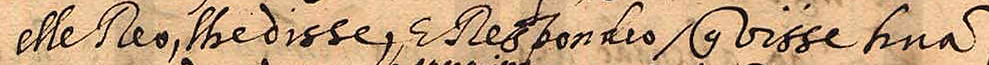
elle Reo, lhe disse, E Respondeo / q̅ visse huā
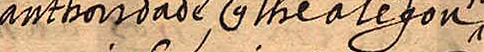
authoridade, q̅ alegou
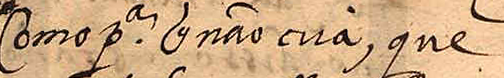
Como pa. q̅ não cria, que
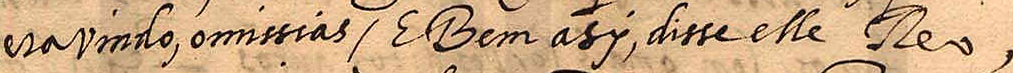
era vindo, o missias / E Bem asy, disse elle Reo,
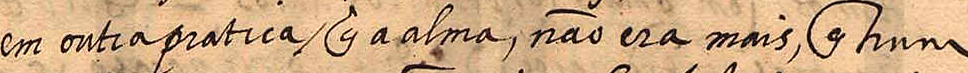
em outra pratica / q̅ a alma, não era mais, q̅ hum
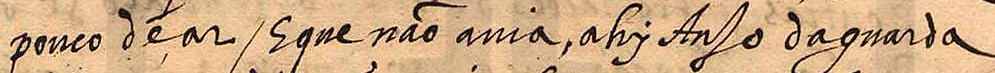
pouco de ar / E que não auia, ahy Anjo da guarda
